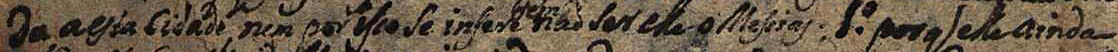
da, a esta Cidade, nem por isso se infere bem naõ ser elle o Messias: 1.o porq̄ elle ainda
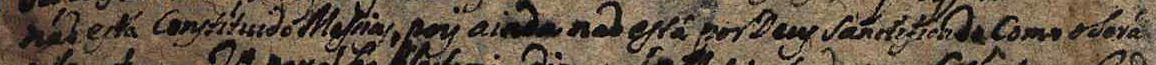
naõ está Constituido Messias, pois ainda naõ está por Deus sanctificado Como o Será
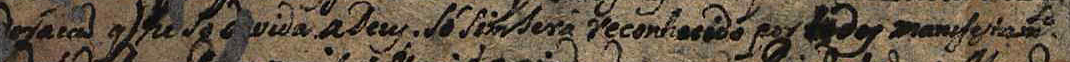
_oraçaõ q̄ he so _vida a Deus. só sim será reconhecido por todos manifestam.te
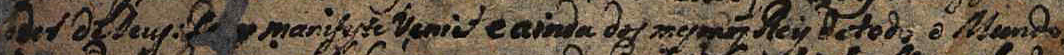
oder de Deus: _ manifeste Venia e ainda dos mesmos Reis de todo o Mundo
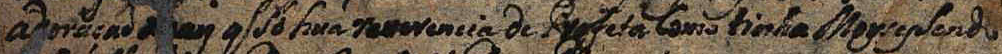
adoraçaõ mais q̄ só hua reverencia de Profeta Como tinha Moyses Sendo
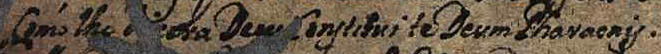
Como lhe _ora Deu_ Constetui te Deum Pharaonis.
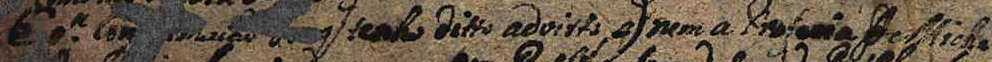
e p.a Con ___iaõ do q̄ tenho ditto advirto, q̄ nem a Profecia De Miche
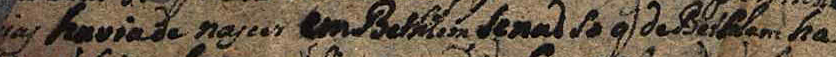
ias havia de nascer em Bethlem senaõ só q̄ de Bethlem ha
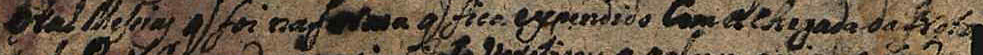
O tal Messias q̄ foi na forma q̄ fica expendido Com a chegada da frota
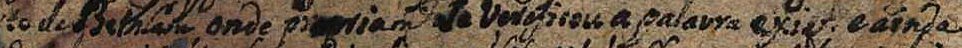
to de Bethlam, onde propriamte se vereficou a palavra exiet; e ainda
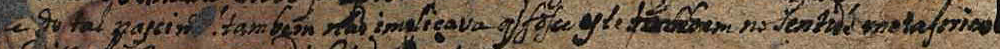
e do tal nascim_ tambem naõ implicava q̄ fosse este tambem no sentido metaforico
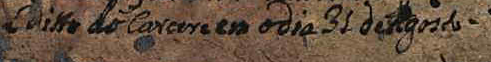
Editto do Carcere em o dia 31 de Agosto.
